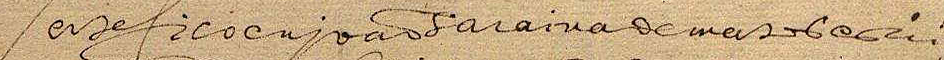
Certefico eu joão saraiua de matos escri
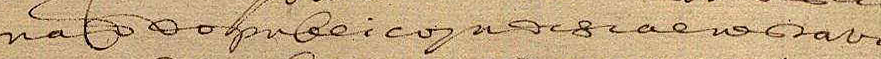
uaõ do publico judisial nesta vi
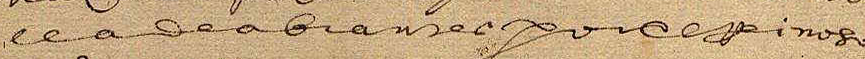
lla de abrantes por el Rei noso
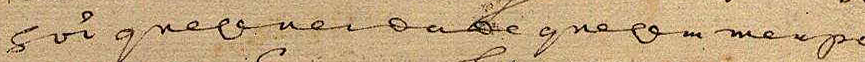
sor̄ que he uerdade que hem meu po
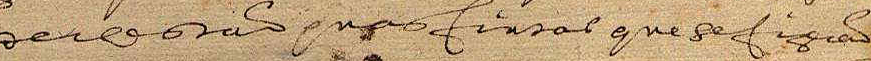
der hestaõ huas fintas que se fizerão
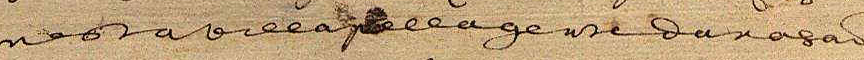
nesta villa pella gente da nasão
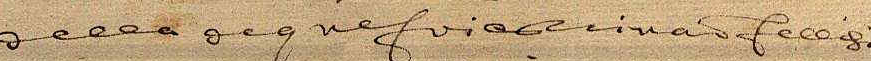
della de que foi escriuaõ fellisi
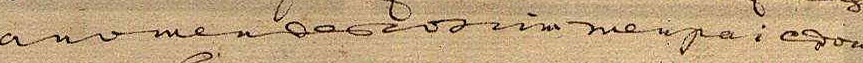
ano mendes cotrim meu pai e dou
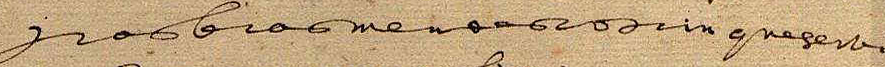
tras bras mendes cotrin que servi
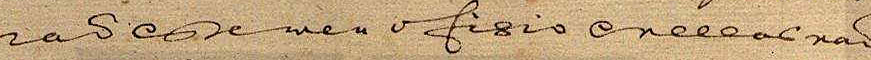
raõ este meu ofisio e nellas naõ
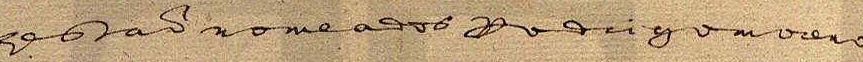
hestaõ nomeados Rodrigo moreno
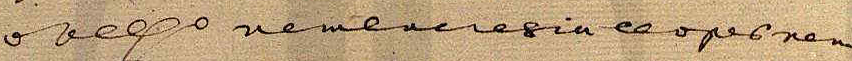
o velho nem lucresia llopes nem
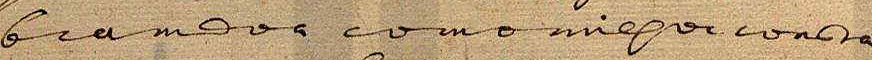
bramdoa como milhor consta
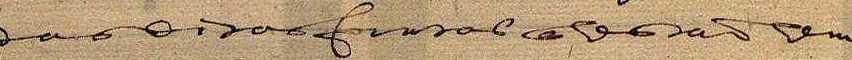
das ditas fintas que hestaõ hem
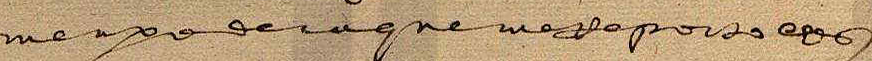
meu poder a que me Reporto e hes
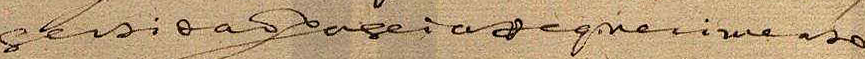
sertidaõ pasei a Requerimento
